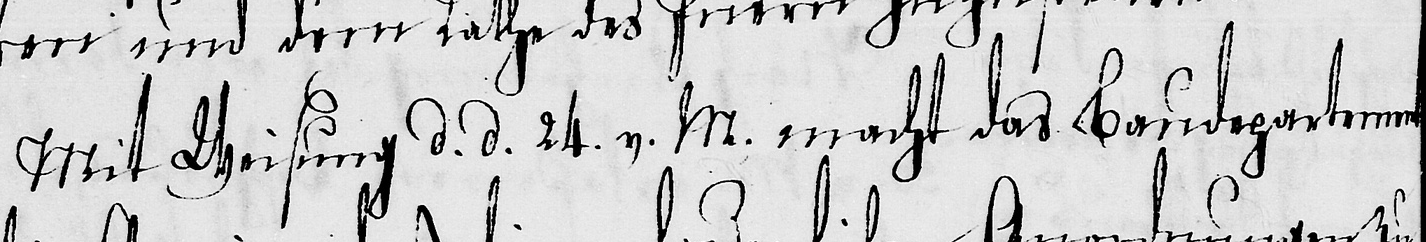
Mit Weisung d. d. 24. v. M. macht das Baudepartement
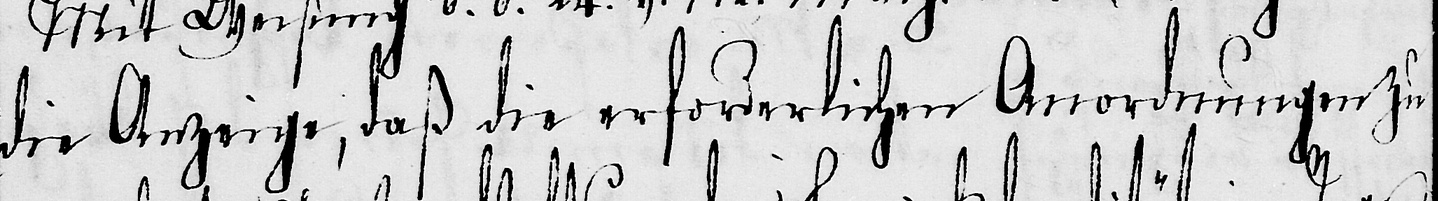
die Anzeige, daß die erforderlichen Anordnungen zu
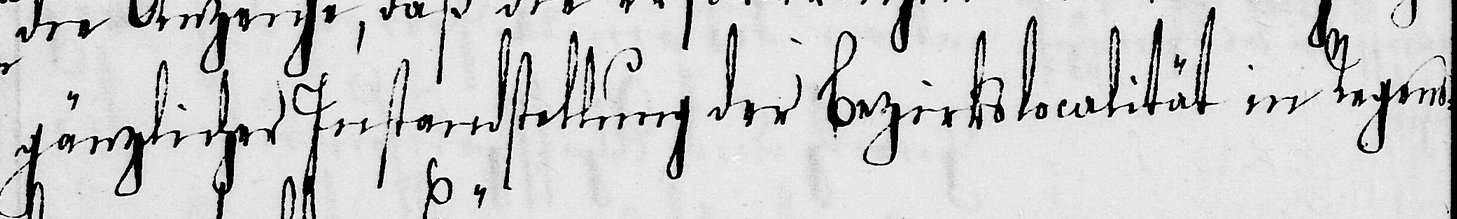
gänzlicher Instandstellung der Bezirkslocalität in Regen¬
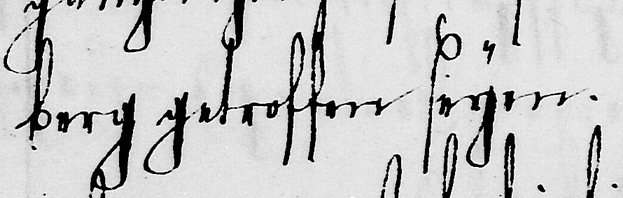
sberg getroffen seyen.
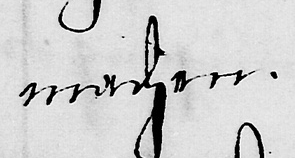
machen.
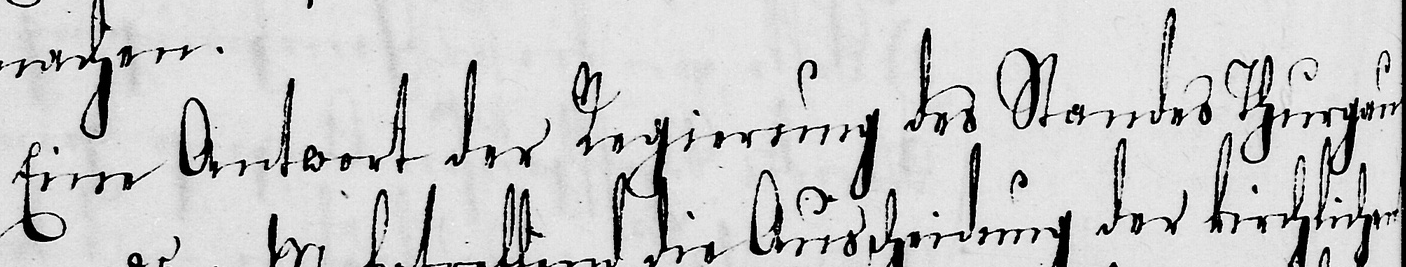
Eine Antwort der Regierung des Standes Thurgau
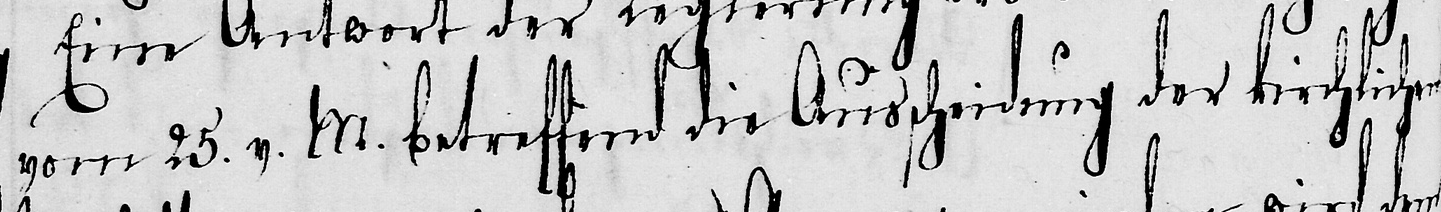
vom 25. v. M. betreffend die Ausscheidung der kirchli¬
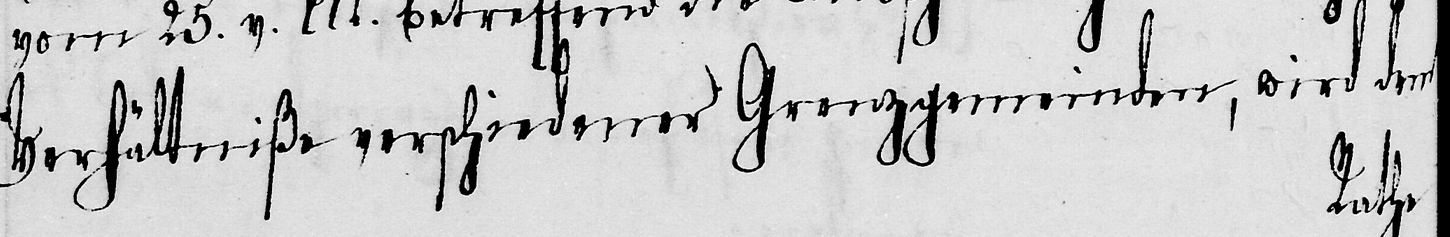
Verhältniße verschiedener Grenzegemeinden, wird dem
